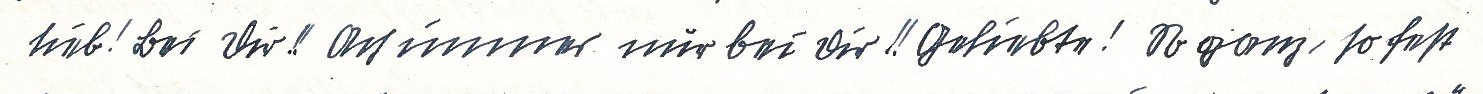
lieb! Bei Dir!! Ach immer nur bei Dir!! Geliebte! So ganz, so fest
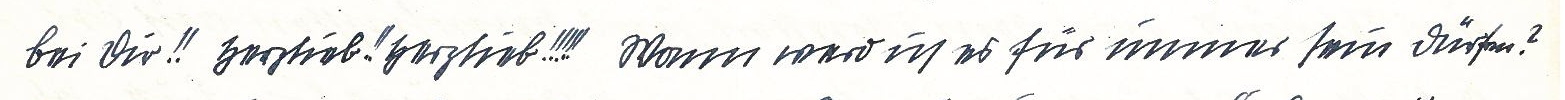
bei Dir!! Herzlieb!! Herzlieb!!!!!! Wann werd ich es für immer sein dürfen?
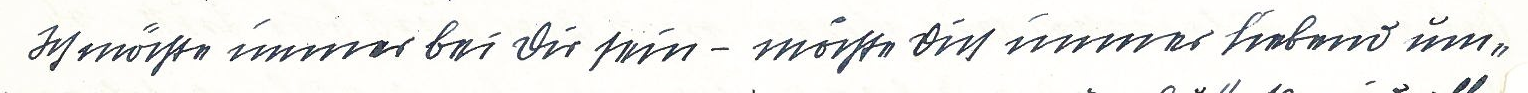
Ich möchte immer bei Dir sein – möchte Dich immer liebend um¬
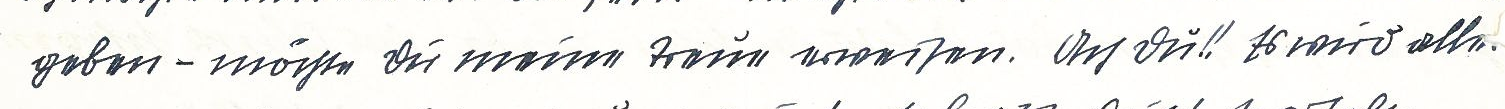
geben – möchte Dir meine Treue erweisen. Ach Du!! Es wird alle
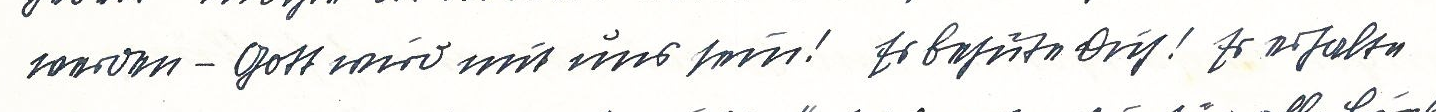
werden – Gott wird mit uns sein! Er behüte Dich! Er erhalte
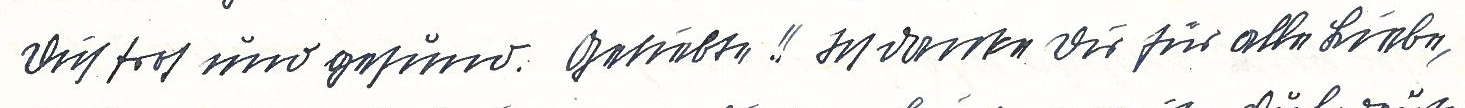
Dich froh und gesund. Geliebte!! Ich danke Dir für alle Liebe,
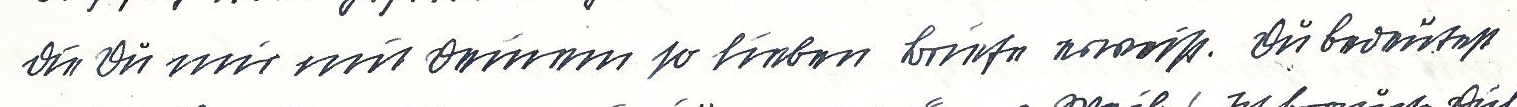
die Du mir mit Deinem so lieben Briefe erweist. Du bedeutest
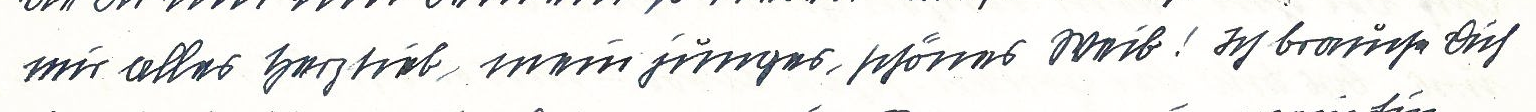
mir alles Herzlieb, mein junges, schönes Weib! Ich brauche Dich
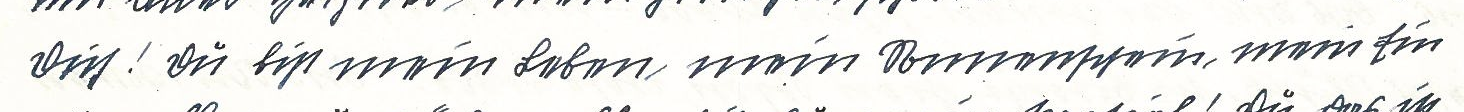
Dich! Du bist mein Leben, mein Sonnenschein, mein Ein
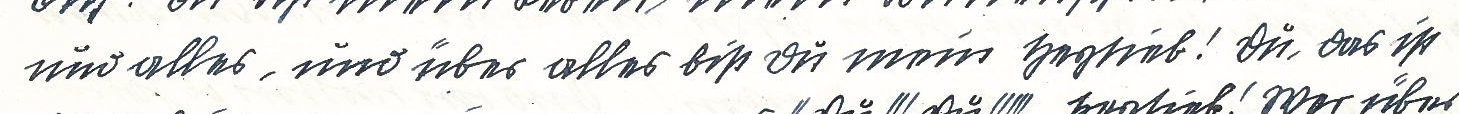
und alles, und über alles bist Du mein Herzlieb! Du, das ist
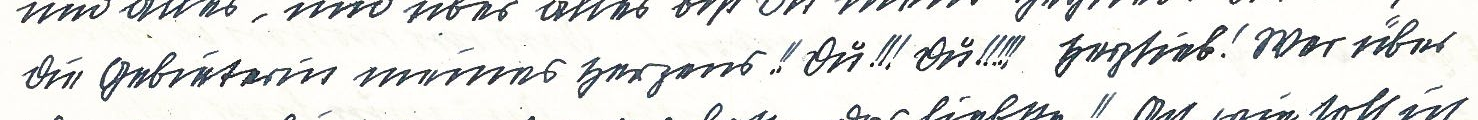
die Gebieterin meines Herzens!! Du!!! Du!!!!! Herzlieb! Wer über
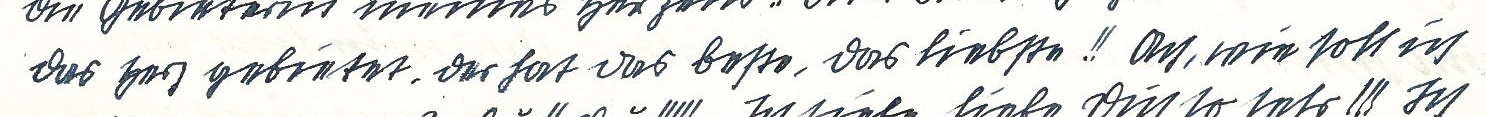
das Herz gebietet, der hat das beste, das liebste!! Ach, wie soll ich
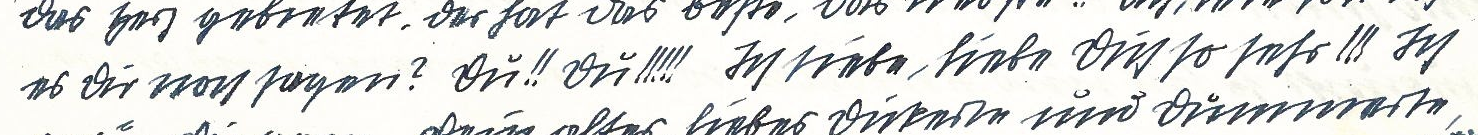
es Dir noch sagen? Du!! Du!!!!! Ich liebe, liebe Dich so sehr!!! Ich
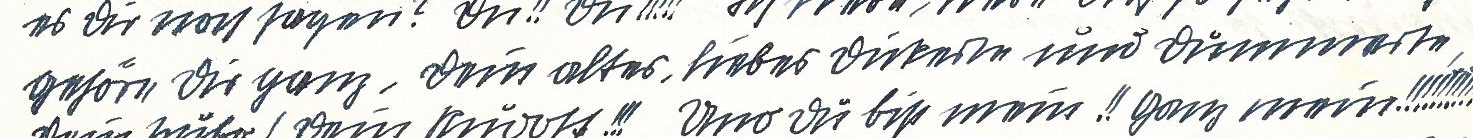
gehöre Dir ganz, Dein altes, liebes Dickerle und Dummerle,
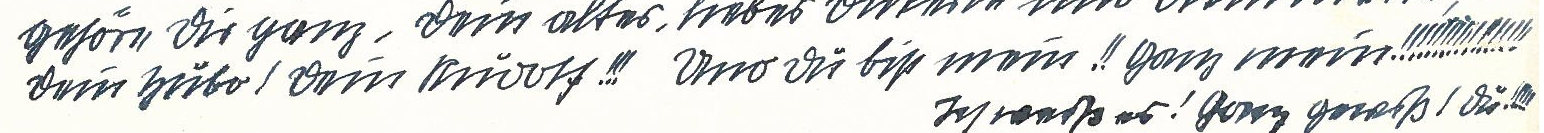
Dein Hubo! Dein !!! Und Du bist mein!! Ganz mein!!!!!!!!!!!!!!!!
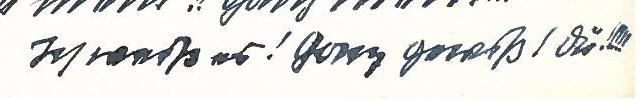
Ich weiß es! Ganz gewiß! Du!!!!.
